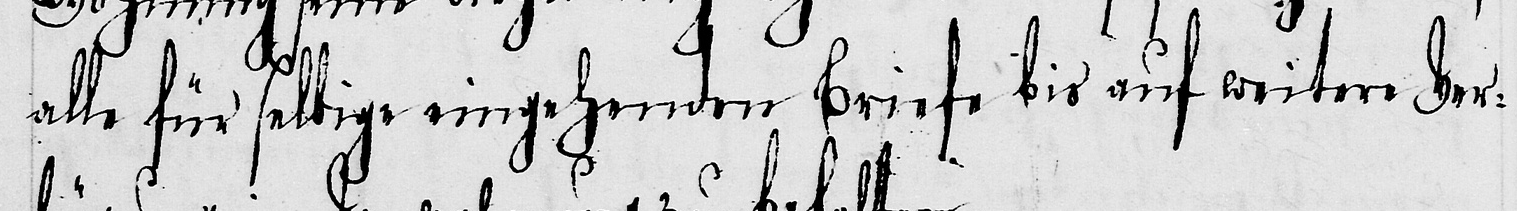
alle für selbige eingehenden Briefe bis auf weitere Ver¬
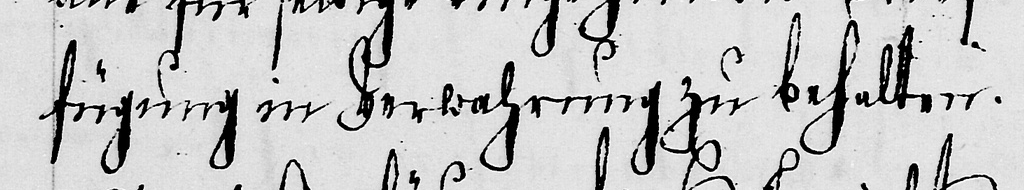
fügung in Verwahrung zu behalten.
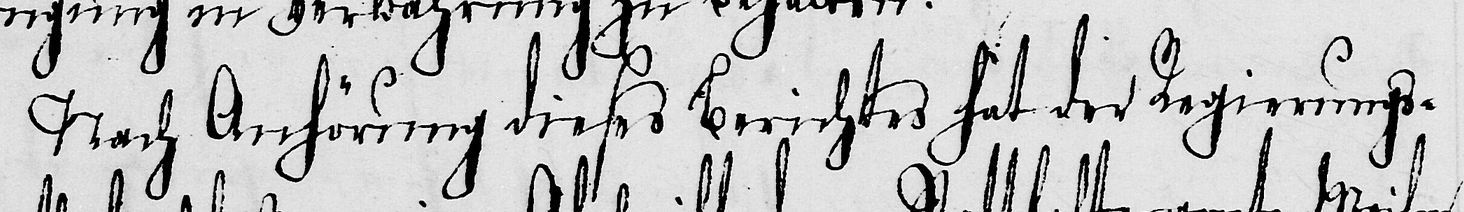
Nach Anhörung dieses Berichtes hat der Regierungs¬
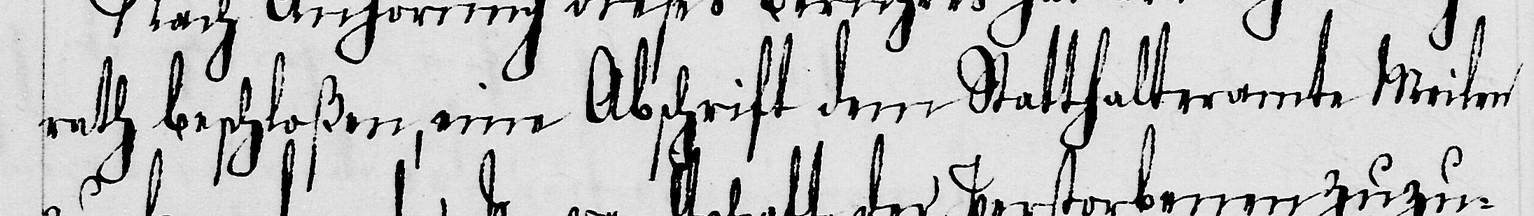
rath beschloßen, eine Abschrift dem Statthalteramte Meilen
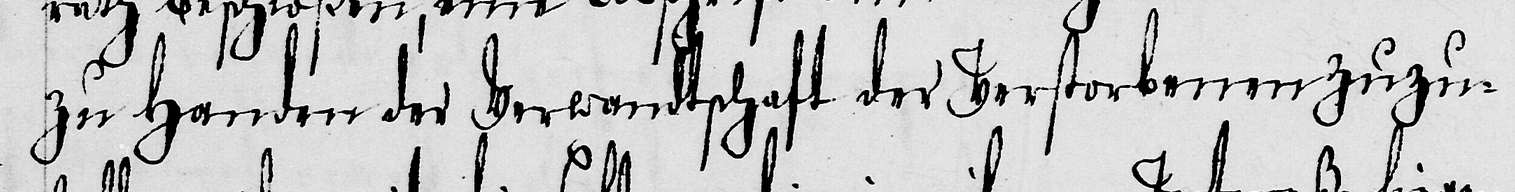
zu Handen der Verwandtschaft der Verstorbenen zuzu¬
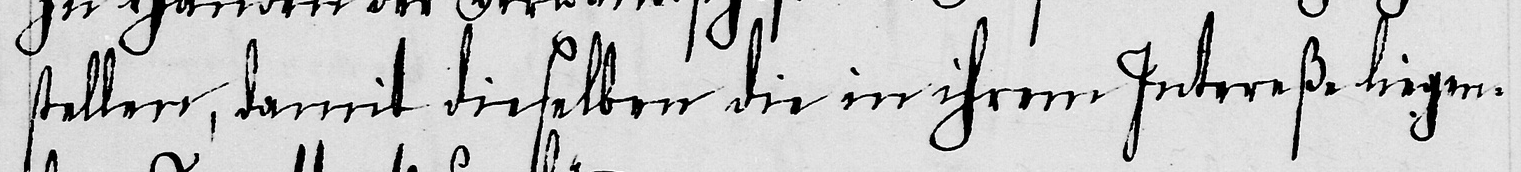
stellen, damit dieselben die in ihrem Intereße liegen¬
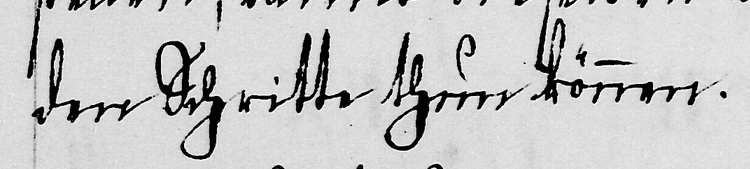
den Schritte thun können.
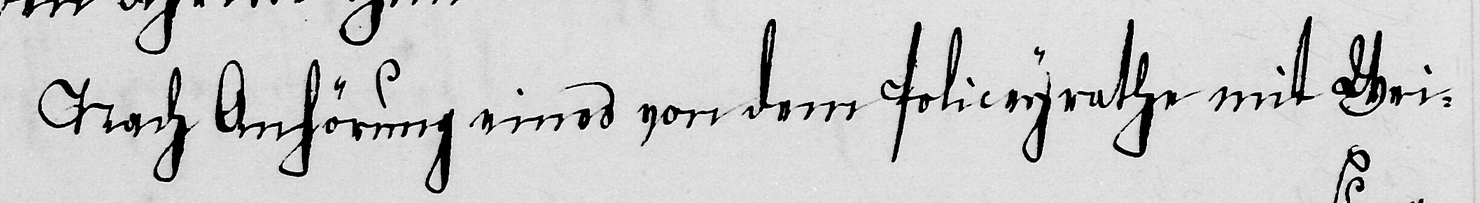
Nach Anhörung eines von dem Policeyrathe mit Wei-
